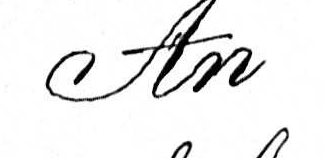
An
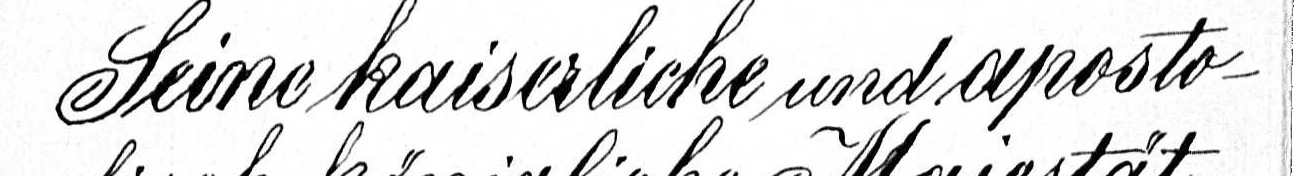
seine kaiserliche und aposto¬
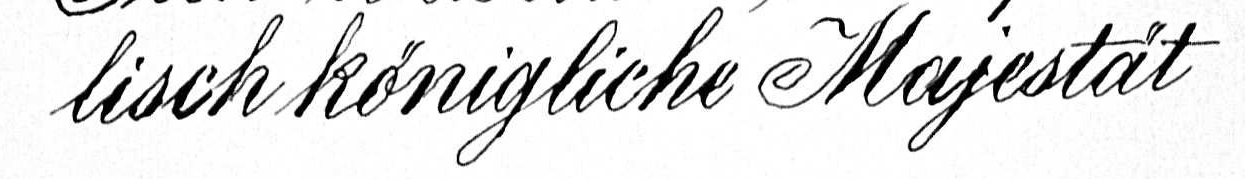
lisch königliche Majestät
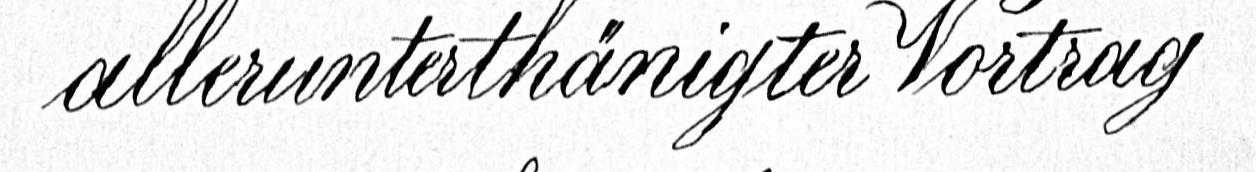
Allerunterthänigster Vortrag
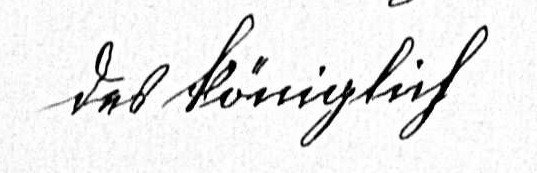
des königlich
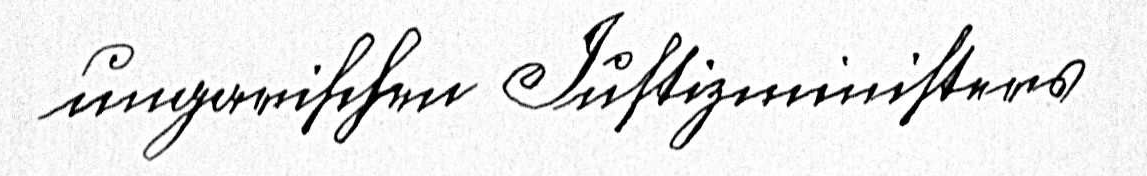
ungarischen Justizministers
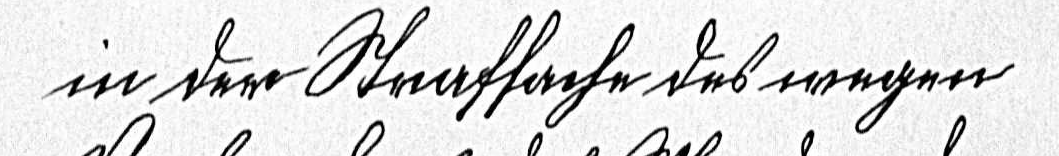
in der Strafsache des wegen
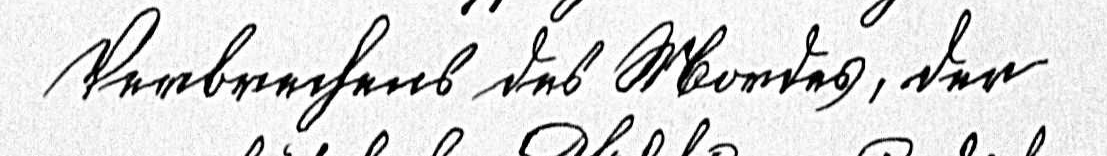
Verbrechens des Mordes, der
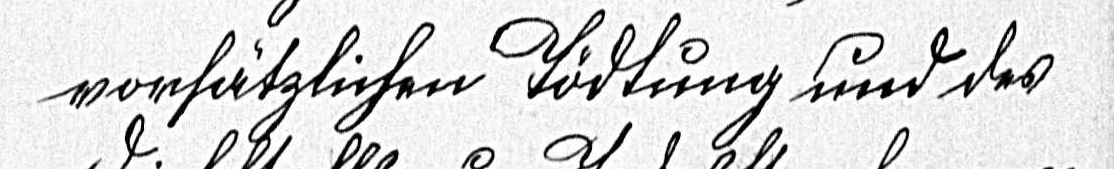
vorsätzlichen Tödtung und des
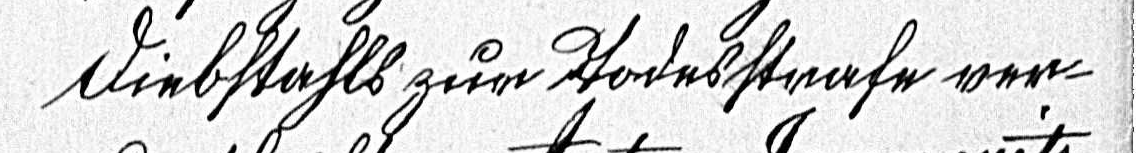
Diebstahls zur Todesstrafe ver¬
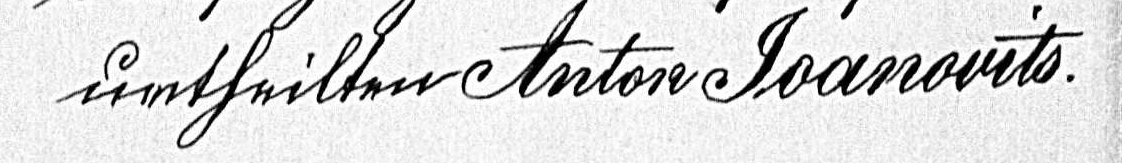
urtheilten Anton Ioanovits
